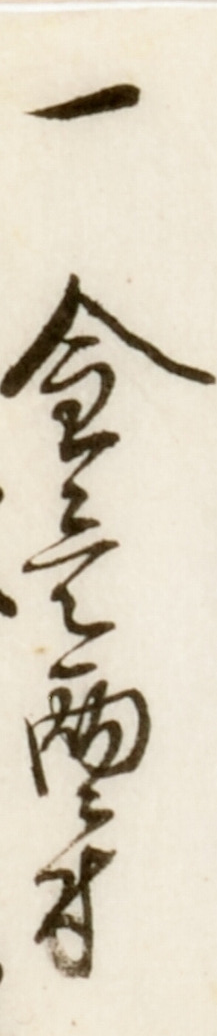一金壱両ニ付
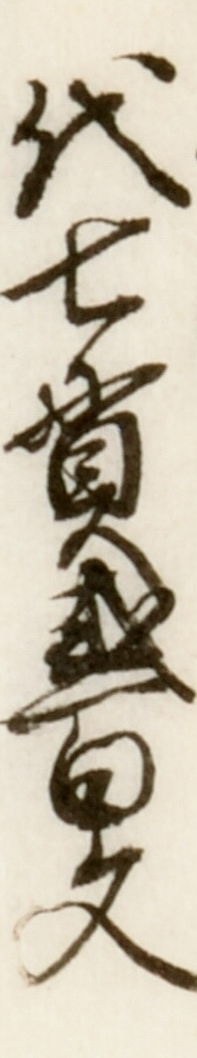代七貫弐百文
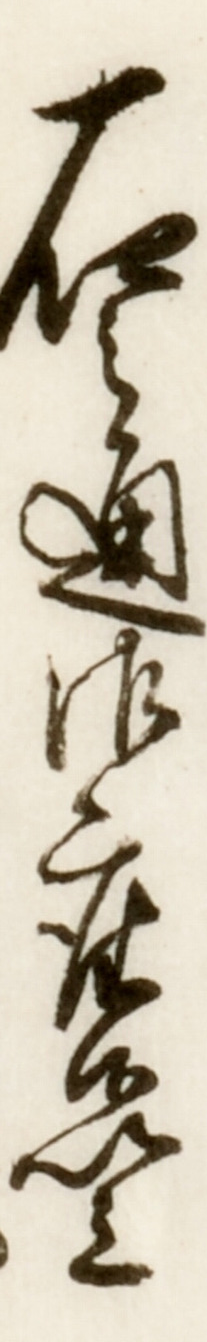右之通御座候以上
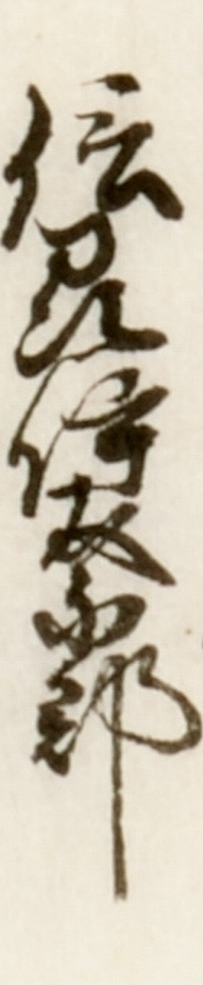信州伊奈郡
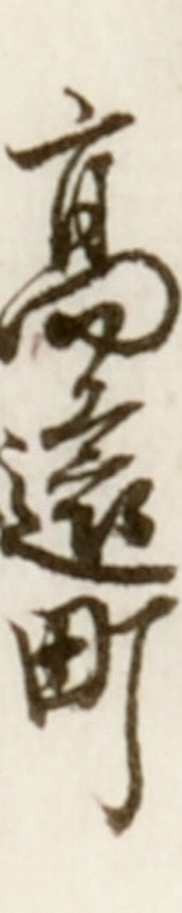高遠町
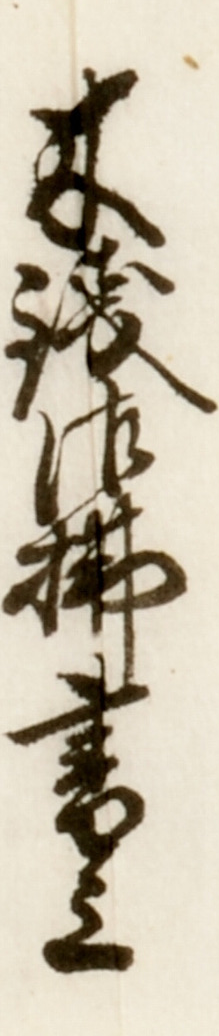木銭御払書上
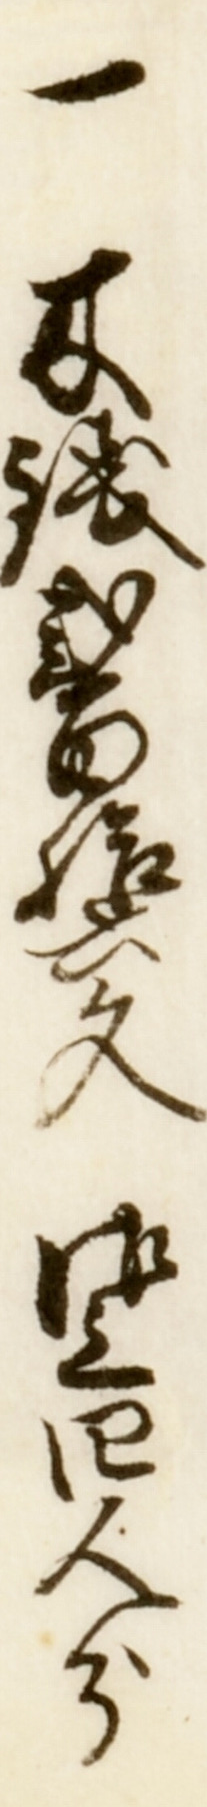一木銭弐百拾六文御上四人分
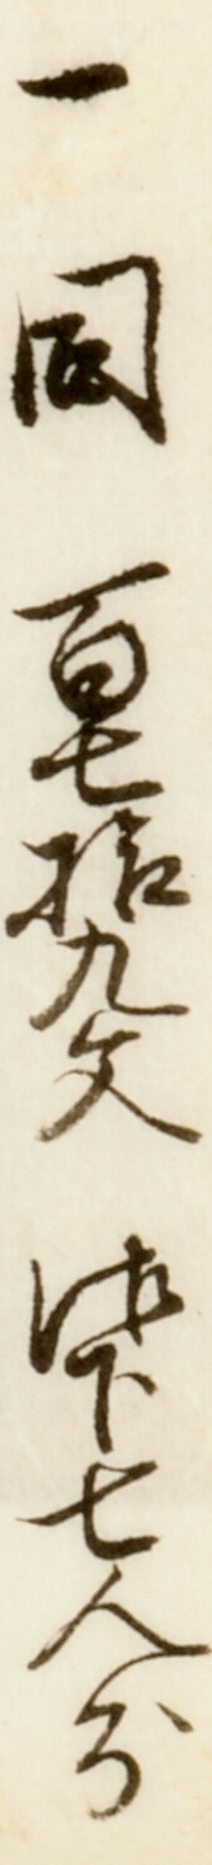一同百七拾九文御下七人分
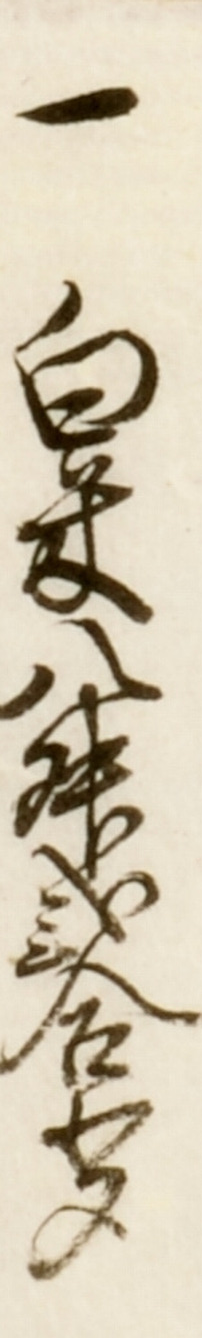一白米八升弐合五勺
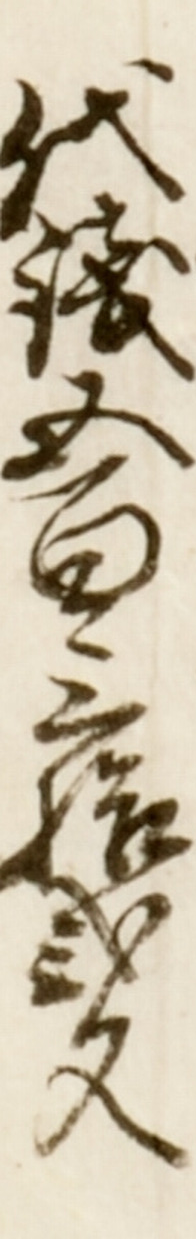代銭五百三拾二文
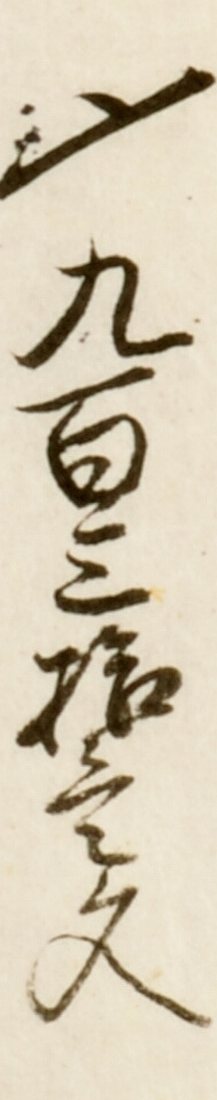〆九百三拾壱文
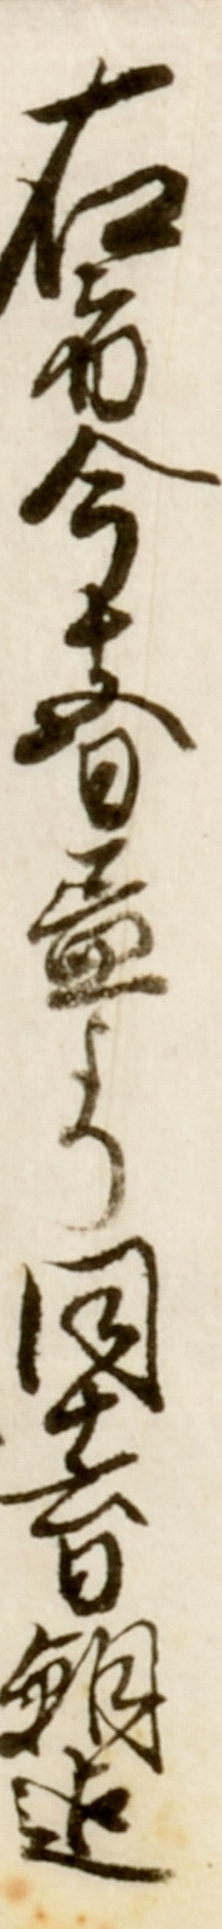右は今十五日昼より同十六日朝迄
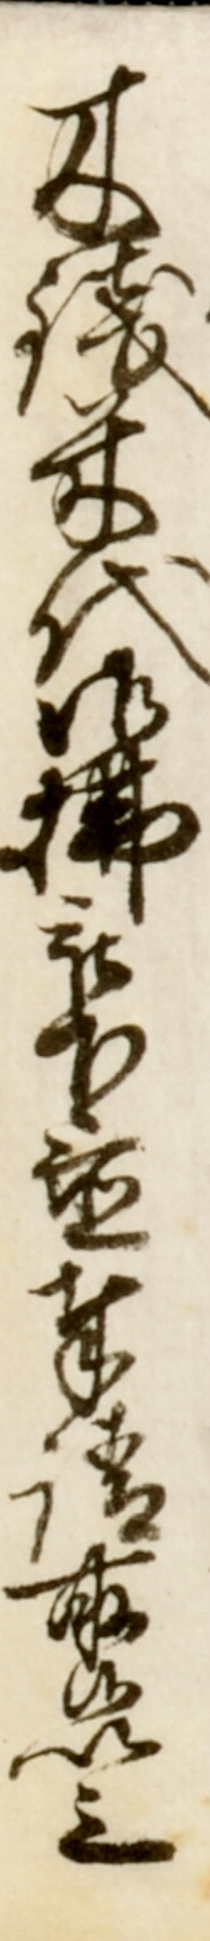木銭米代御払被下置奉請取候以上
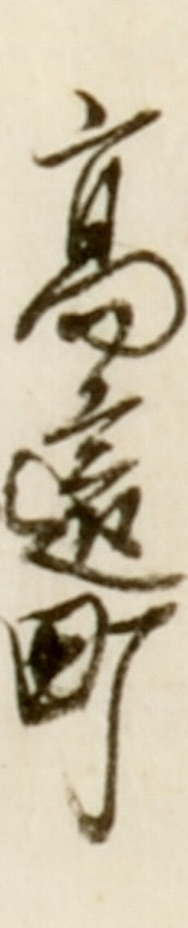高遠町

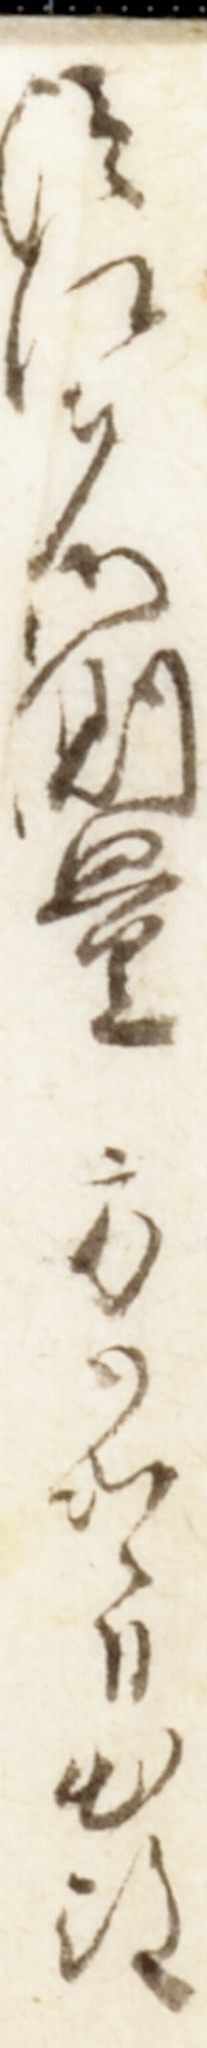請江戸御測量方御出ニ付出役
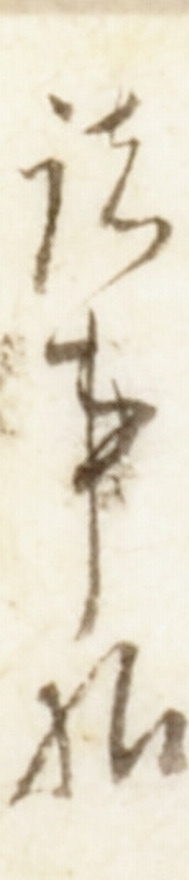諸事扣
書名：諸事控帳
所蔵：伊那市立高遠町図書館・合同会社AMANE
